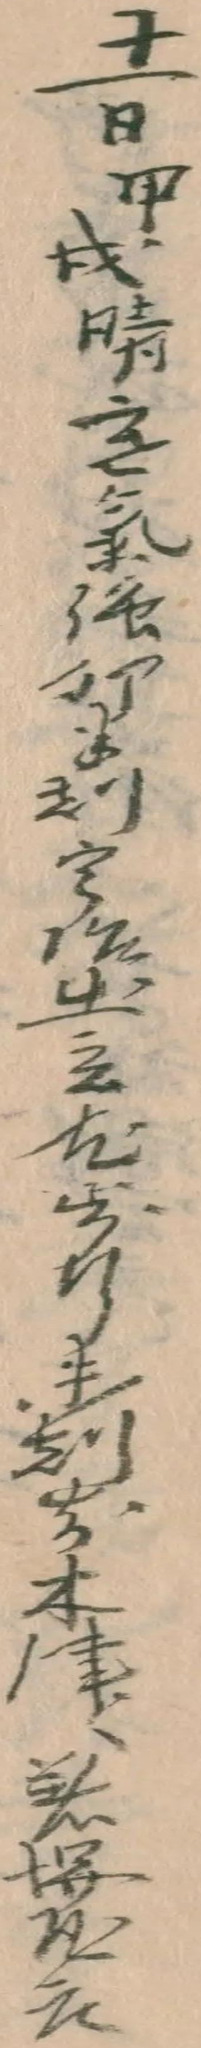十一日甲戌晴寒氣強卯半刻宇治出立尤歩行未刻前木津へ着堺屋庄
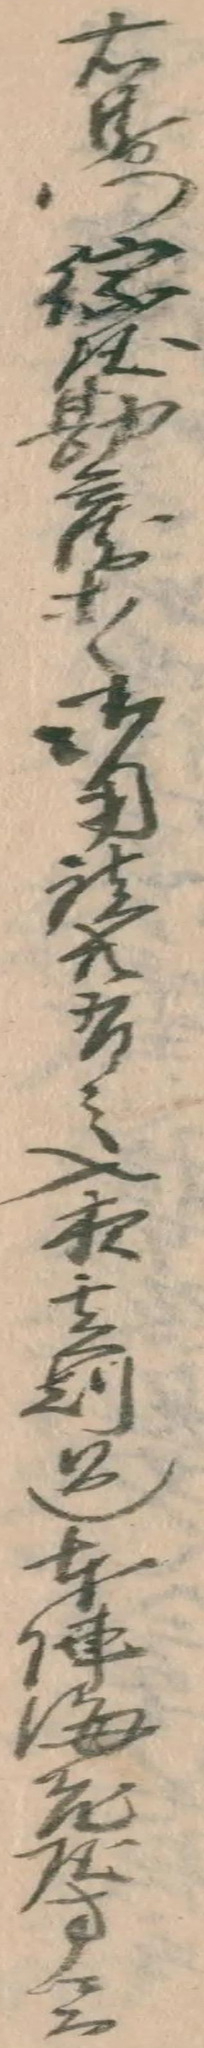右衛門縁屋勘兵衛等へ御用談共有之入夜亥刻過本陣海老屋方ニ而
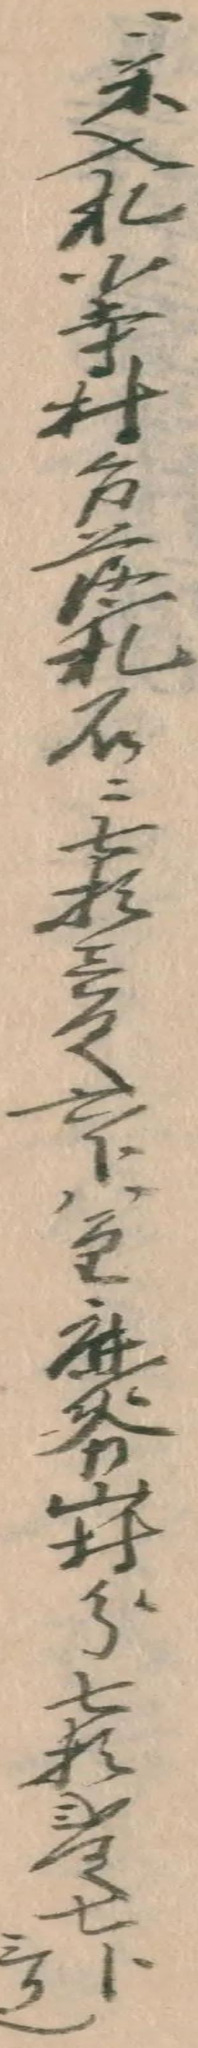御米入札小寺村方落札石ニ七拾壱匁六分八厘鹿谷山村分七拾弐匁七分三厘也
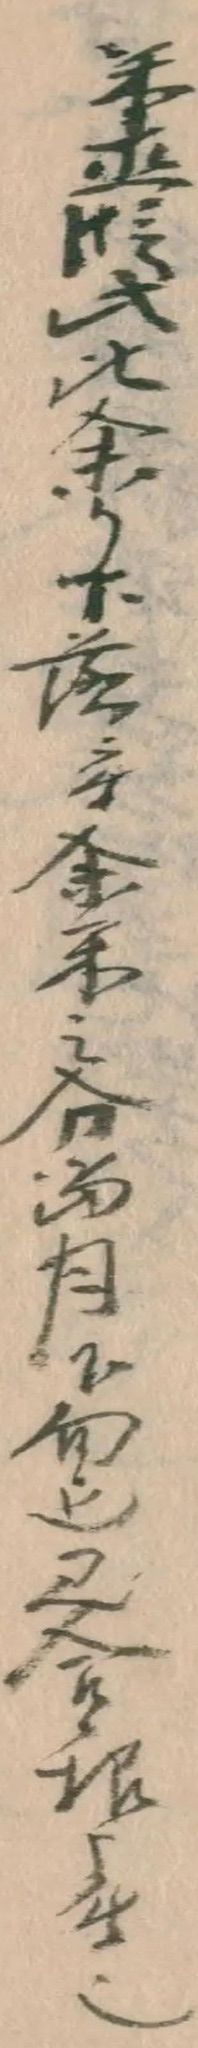米値段此比余り下落ニ付余米之分當月下旬迄見合候様申付也
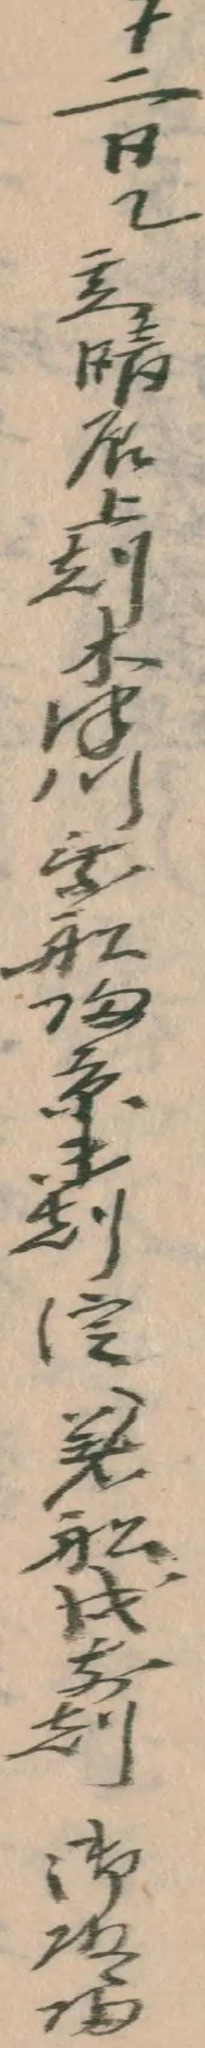十二日乙亥晴辰上刻木津川乗舩帰京未刻淀へ着舩戌前刻御殿ヘ帰
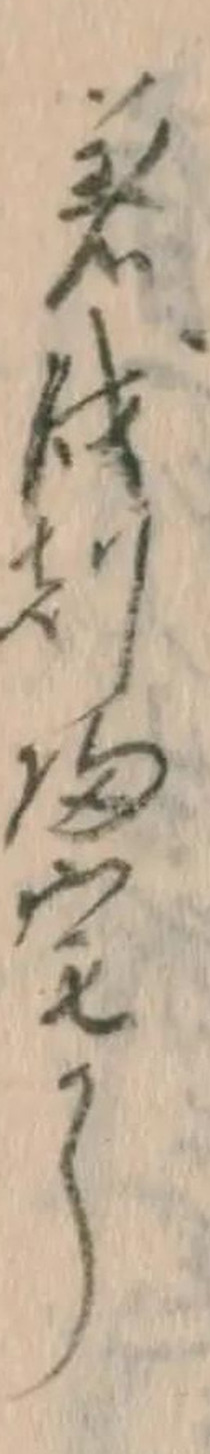着戌刻帰宅了
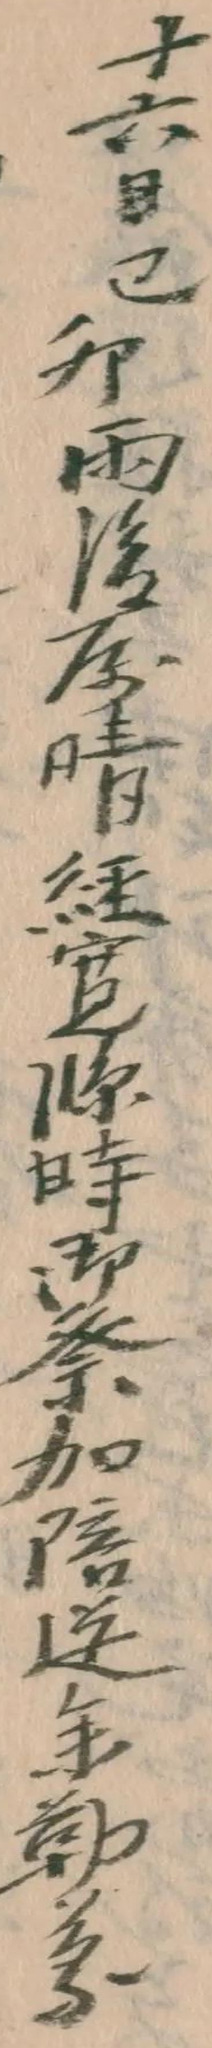十六日己卯雨後属晴経寛臨時御祭加陪従参勤蒙
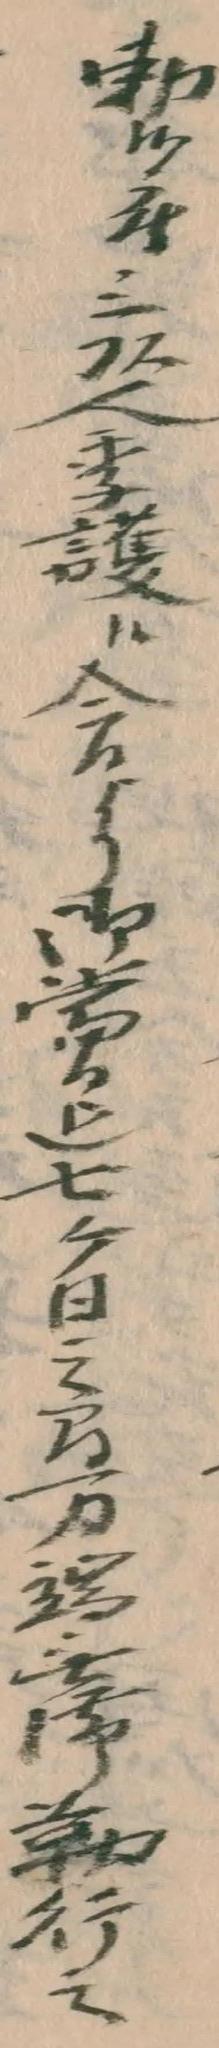勅候ニ付三頭人季護候今日より御當日迄七ヶ日之間万端無滞勤行之
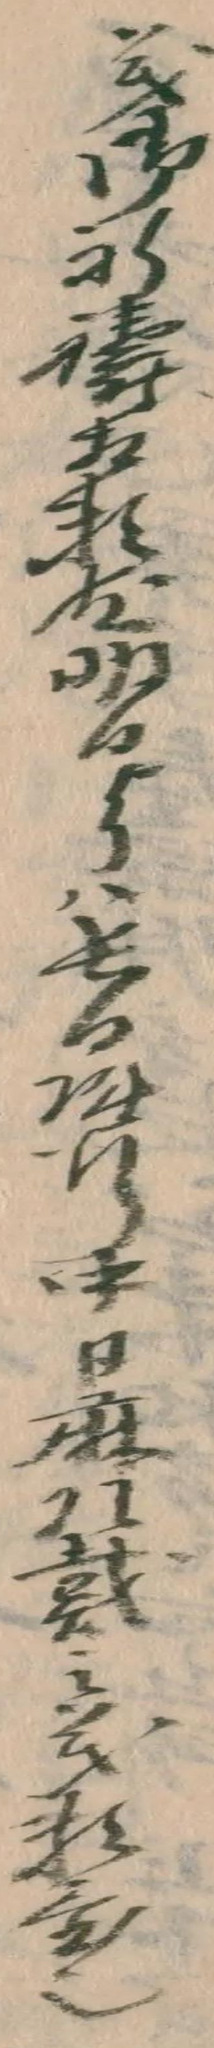義御祈祷相頼尤明日よりハ長日附行中日麻頂戴之義頼置也
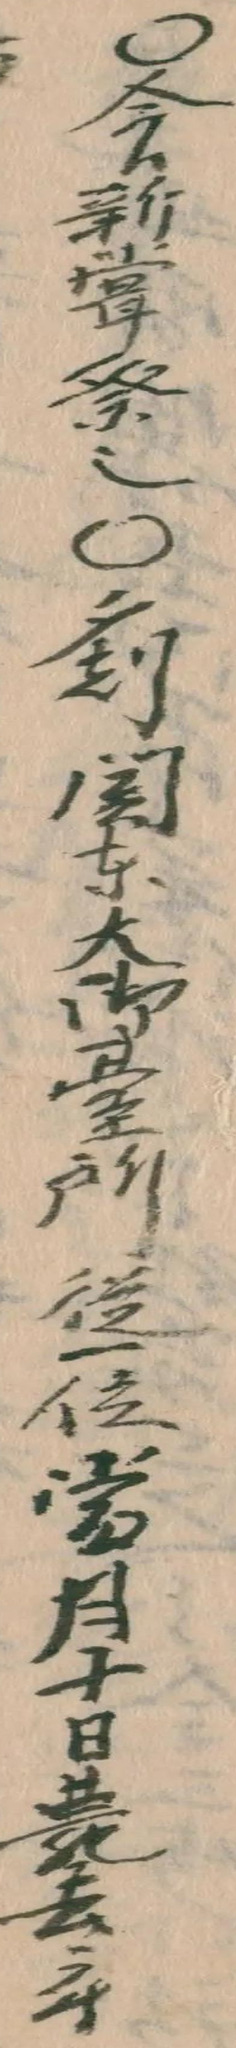○今日新嘗祭也○夕刻関東大御臺所従一位當月十日薨去ニ付
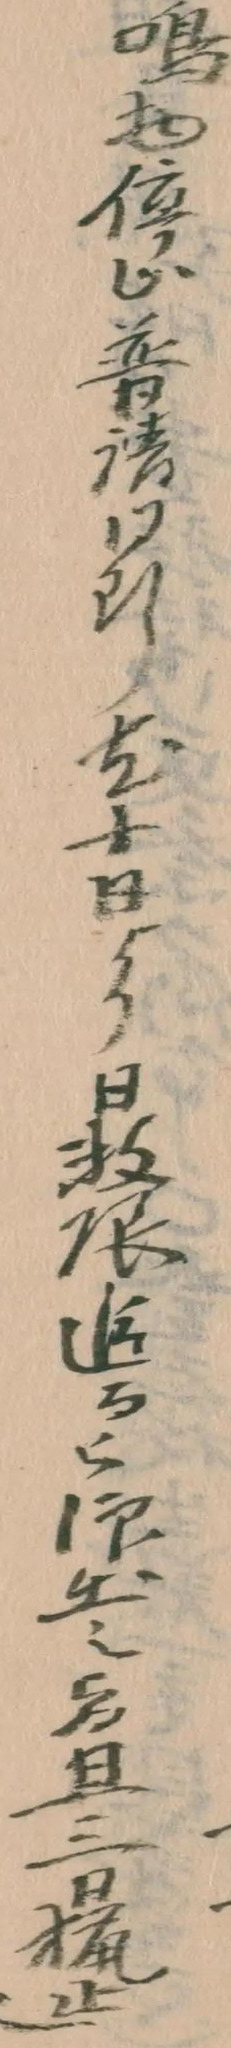鳴物停止普請同断尤十日より日数限追而被仰出之旨且三日猟止也
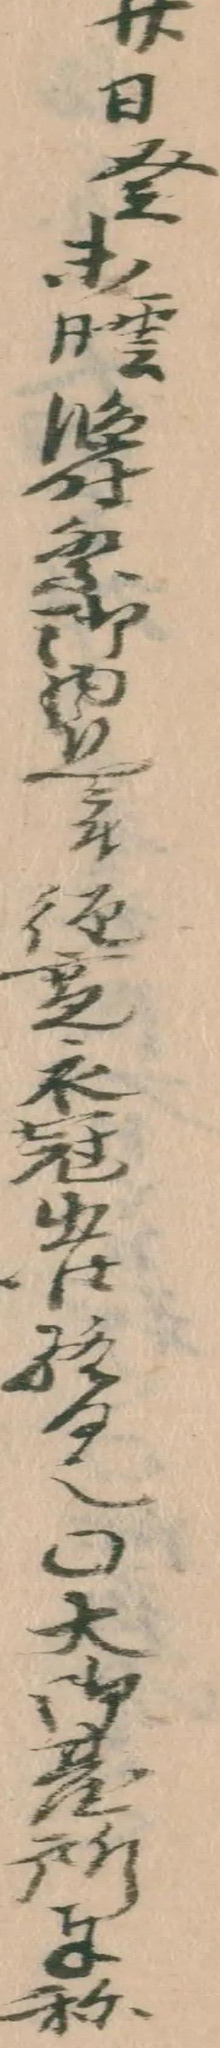廿日癸未曇臨時祭御内見ニ付経寛衣冠出仕終日也○大御臺所奉称
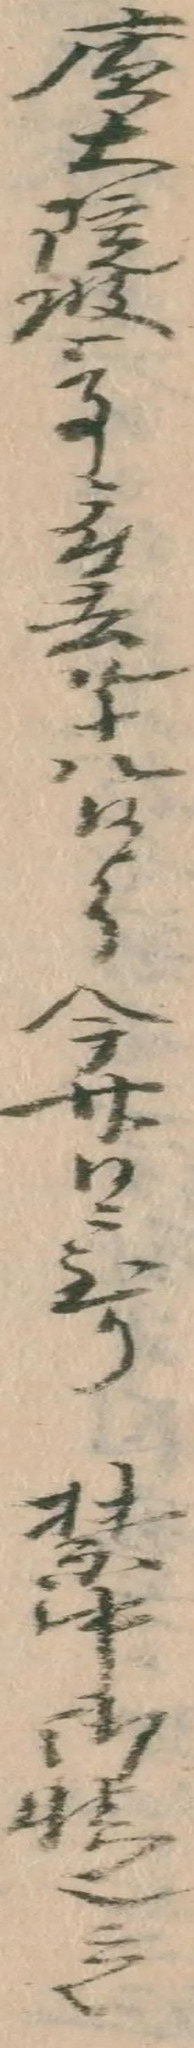廣大院殿御事ニ付去ル十八日より今廿日ニ至り禁中御慎也云々
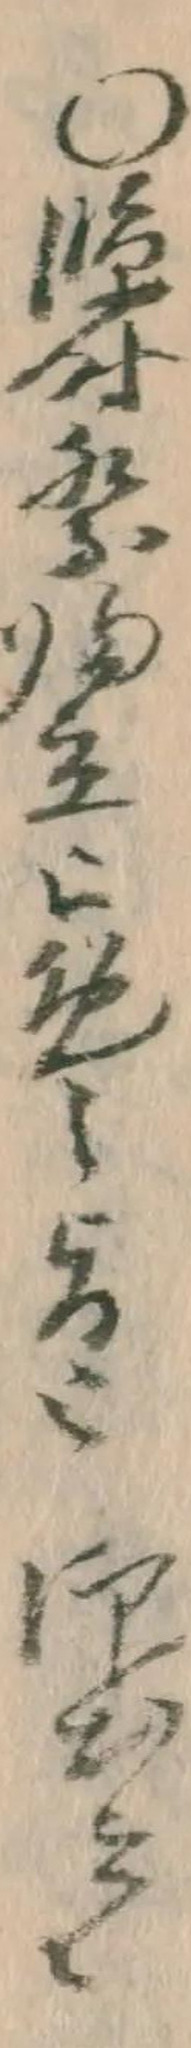○臨時祭帰立被免之旨御仰出候也
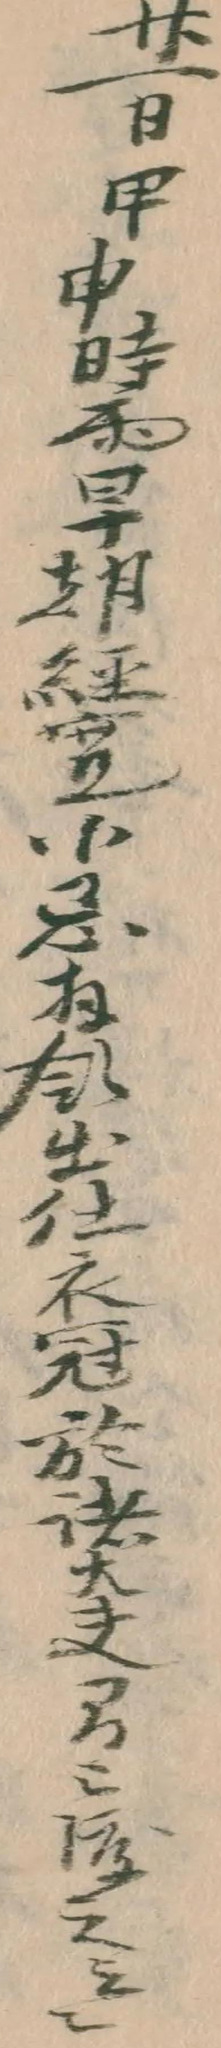廿一日甲申時雨早朝経寛小忌拝領出仕衣冠於諸大夫間被渡之云々
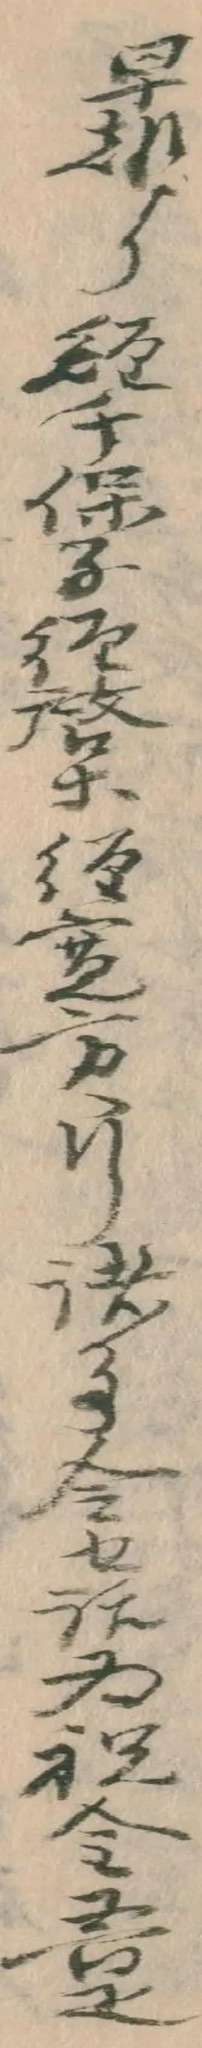早朝より経千保子経啓等経寛方ヘ行諸事令世話為祝金五百疋
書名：賀茂社記録. 第69冊
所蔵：国立国会図書館 National Diet Library, JAPAN
